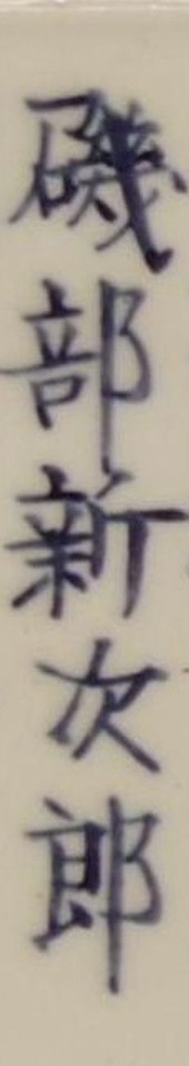磯部新次郎
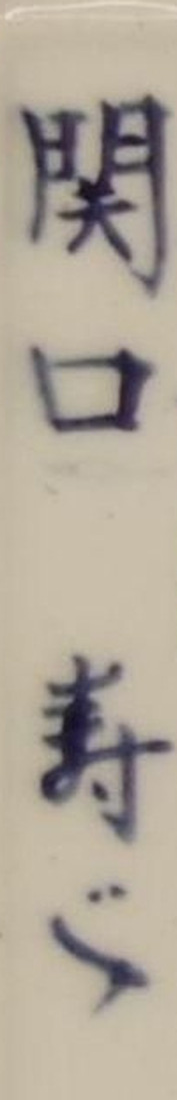関口寿ゞ

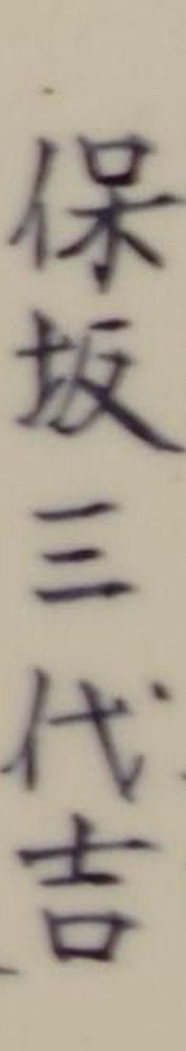保坂三代吉
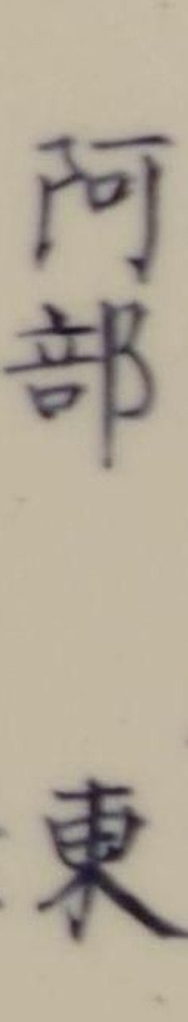阿部東
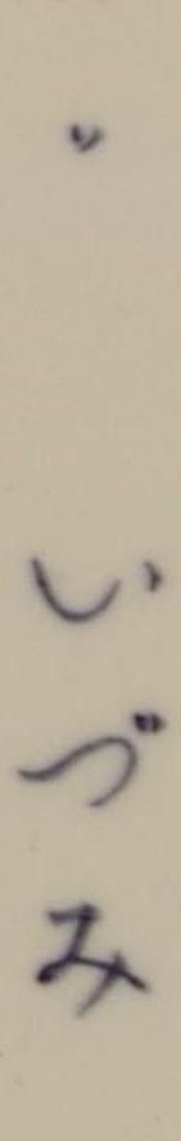いづみ
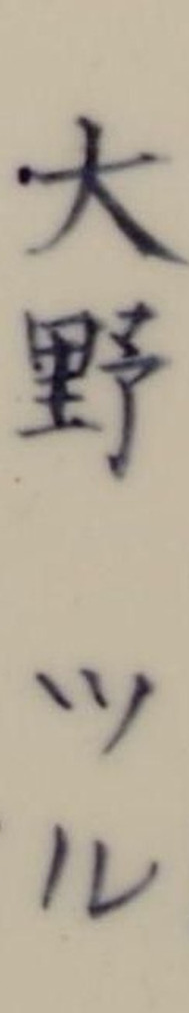大野ツル
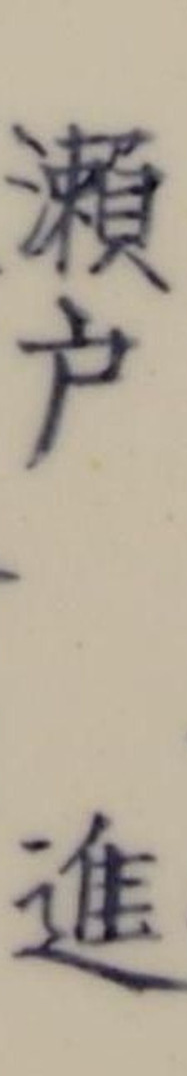瀬戸進
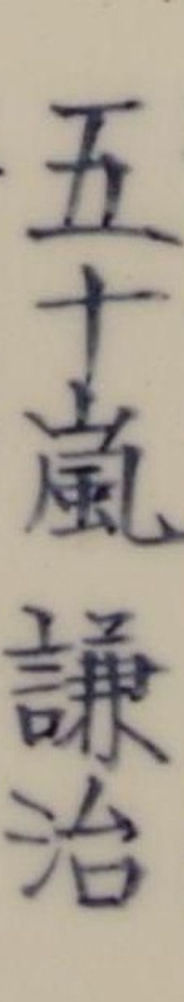五十嵐謙治
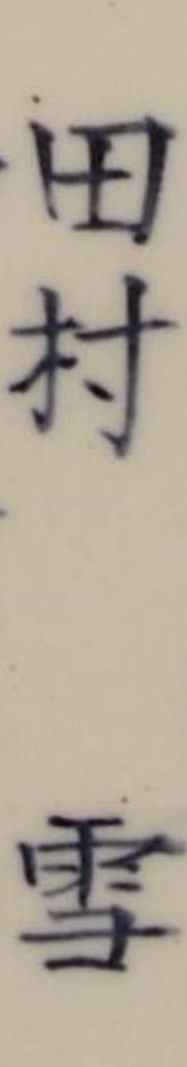田村雪
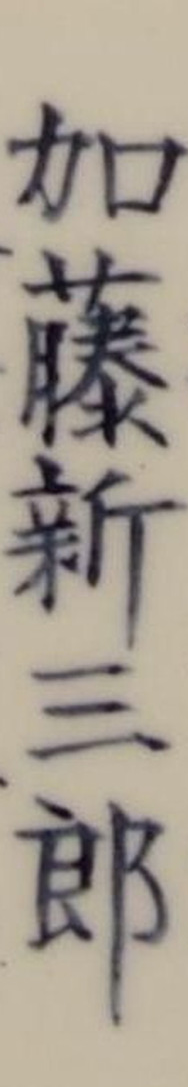加藤新三郎
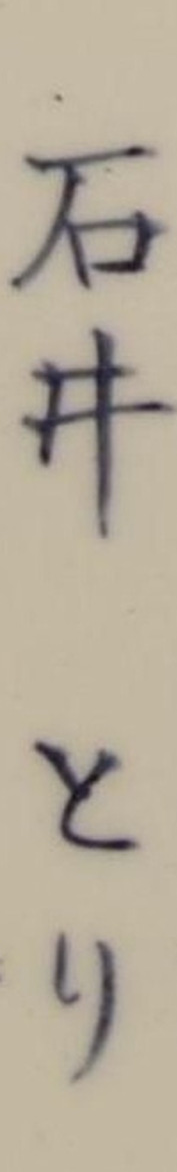石井とり
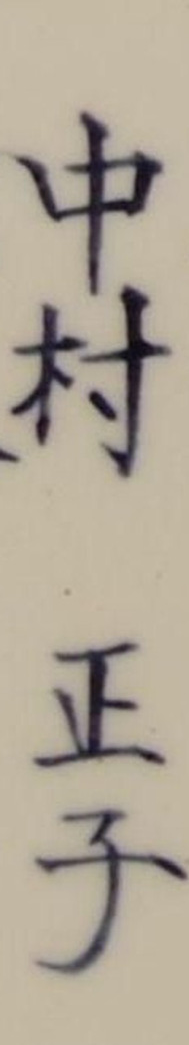中村正子
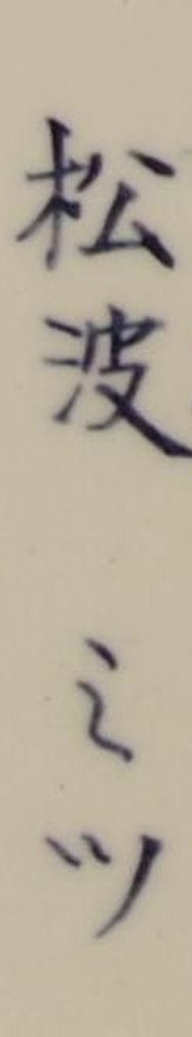松波ミツ

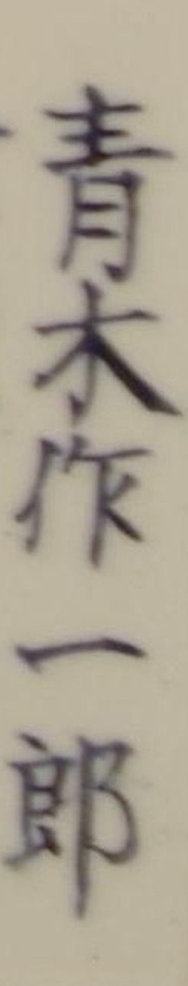青木作一郎
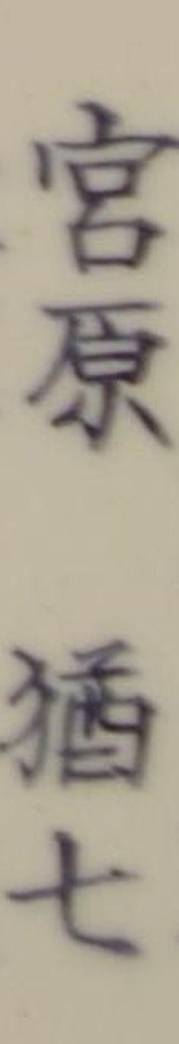宮原猶七
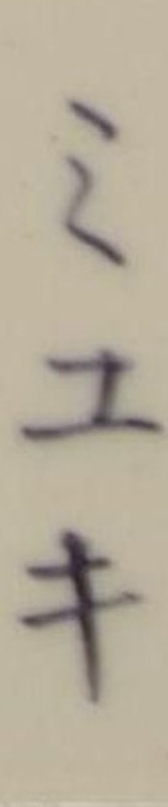ミユキ
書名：M~S
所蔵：高野山金剛峯寺
